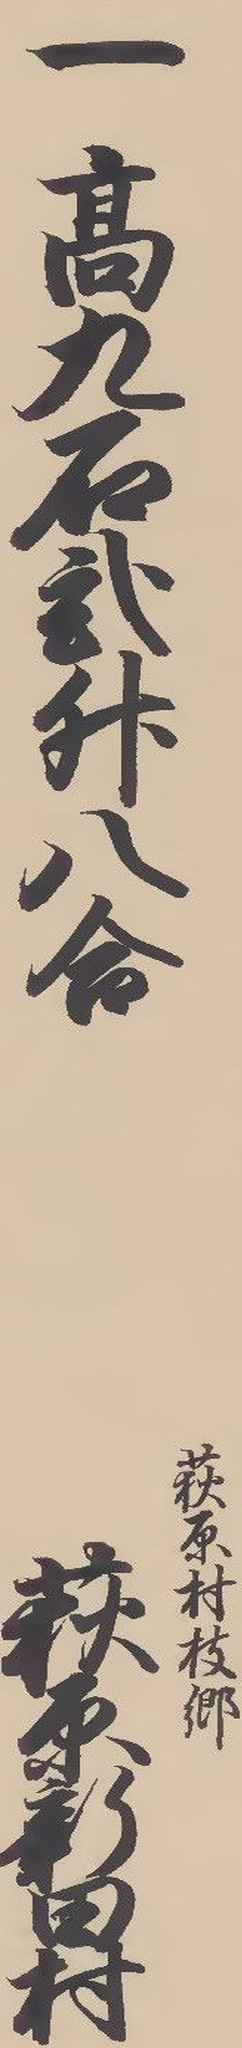一高九石弐升八合荻原新田村
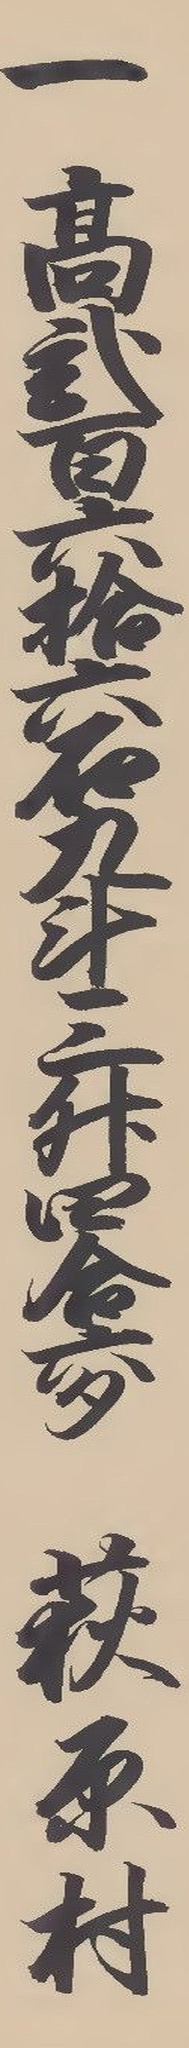一高弐百六拾六石九斗三升四合六勺荻原村
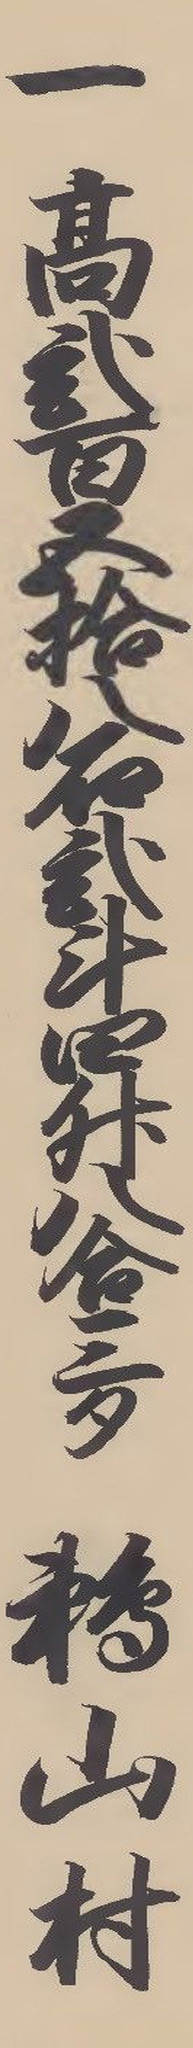一高弐百五拾八石弐斗四升八合三勺鵜山村
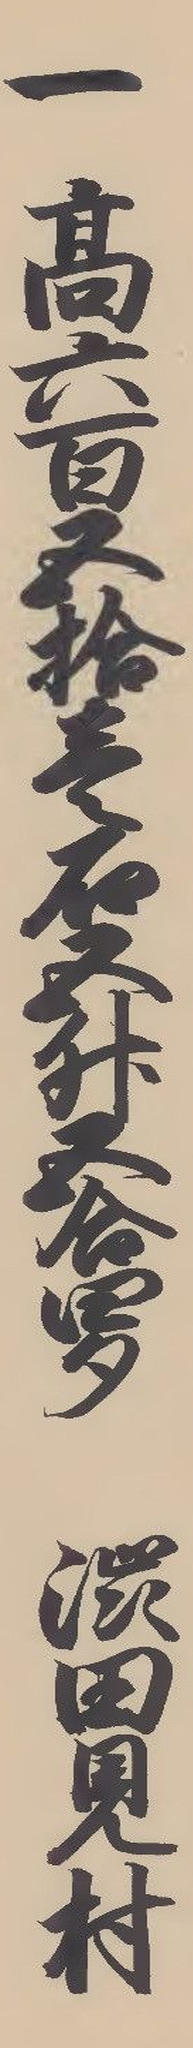一高六百五拾壱石五升五合四勺渋田見村
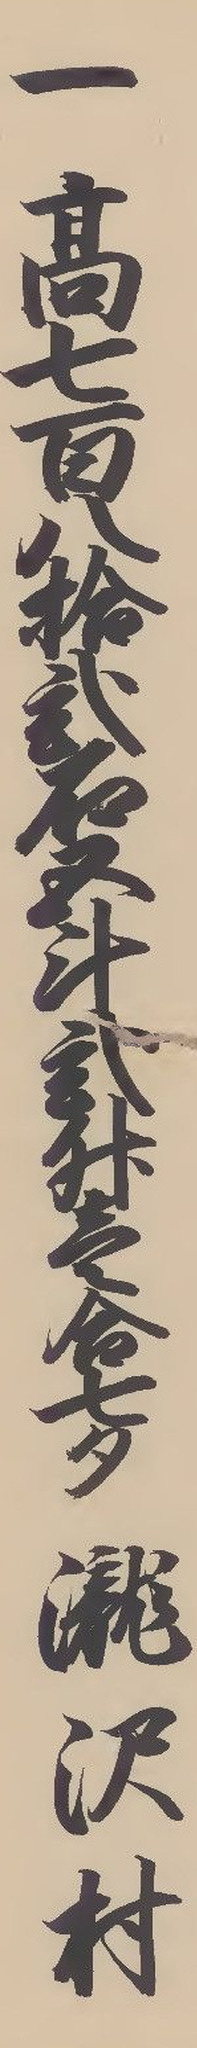一高七百八拾弐石五斗弐升壱合七勺滝沢村

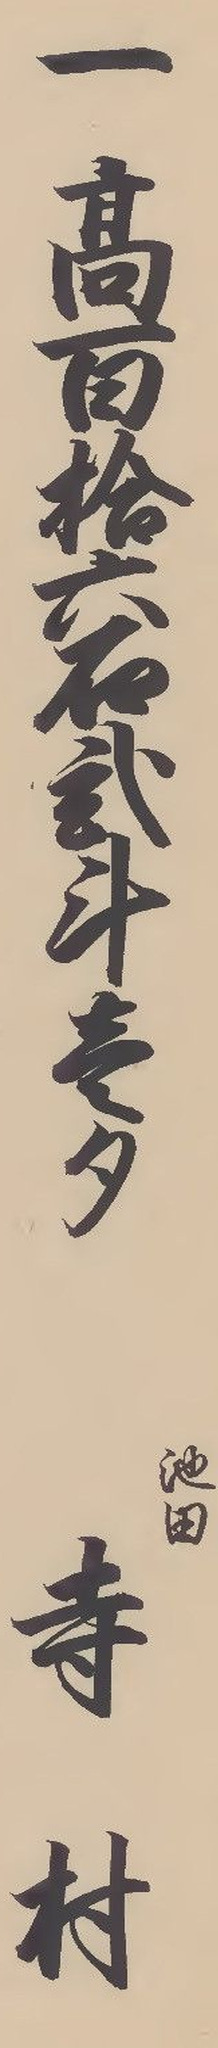一高百拾六石弐斗壱勺寺村
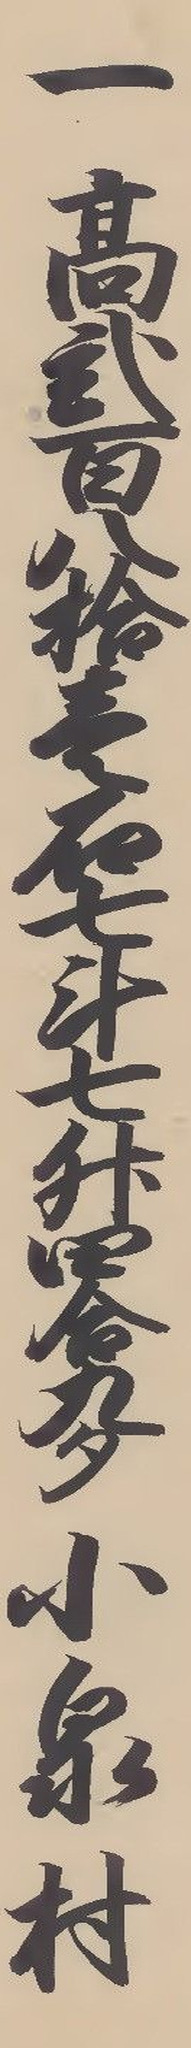一高弐百八拾壱石七斗七升四合九勺小泉村
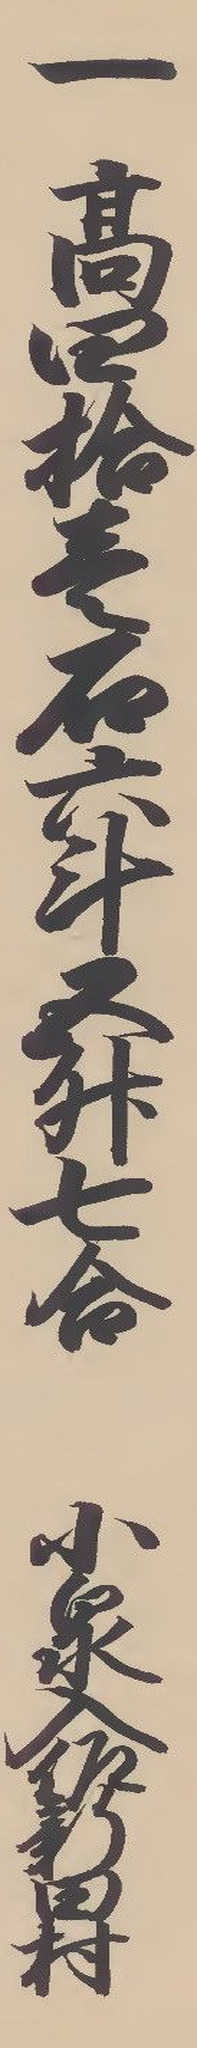一高四拾壱石六斗五升七合小泉入作新田村
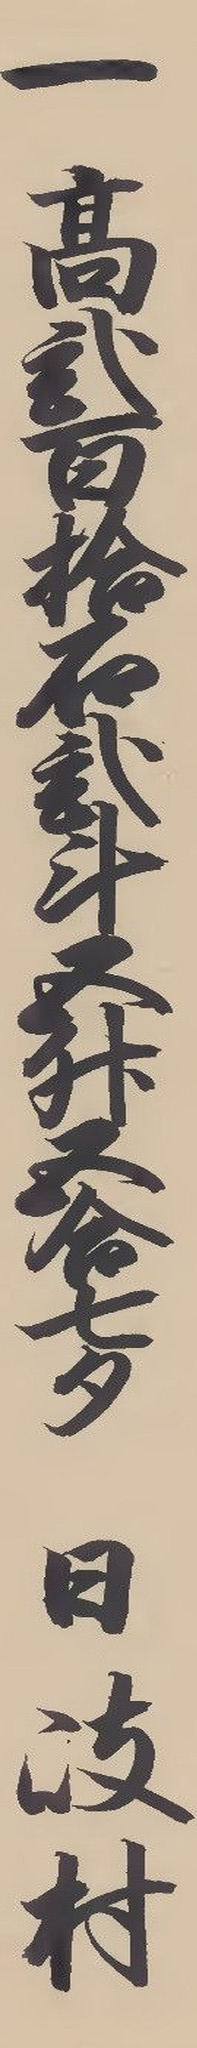一高弐百拾石弐斗五升五合七勺日岐村
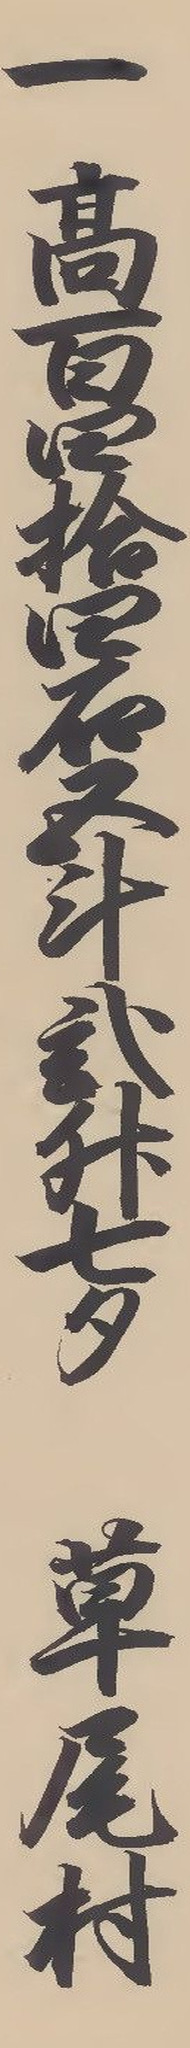一高百四拾四石五斗弐升七勺草尾村
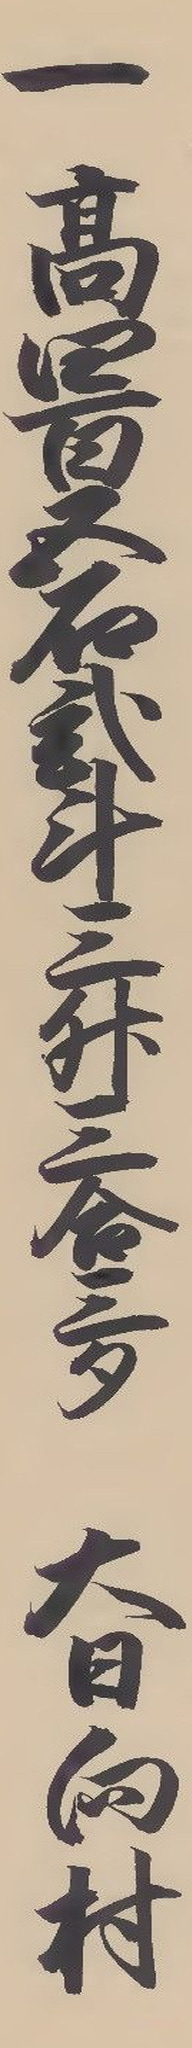一高四百五石弐斗三升三合三勺大日向村

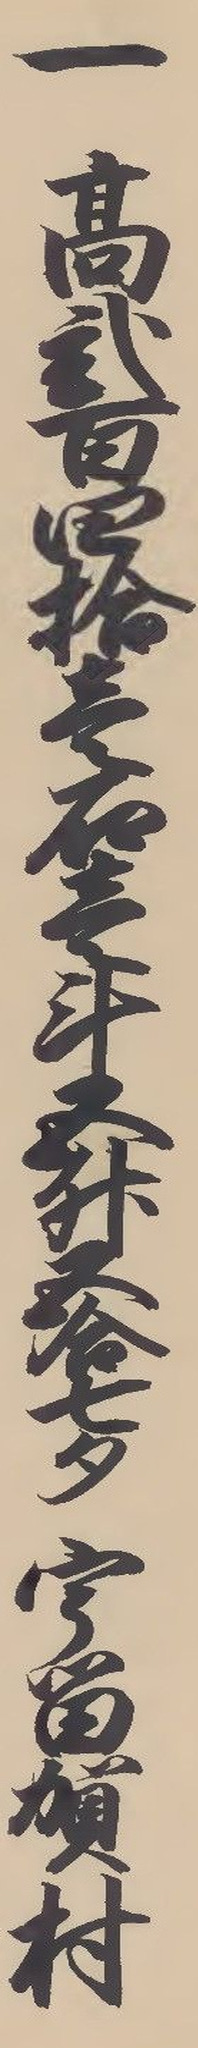一高弐百四拾壱石壱斗五升五合七勺宇留賀村
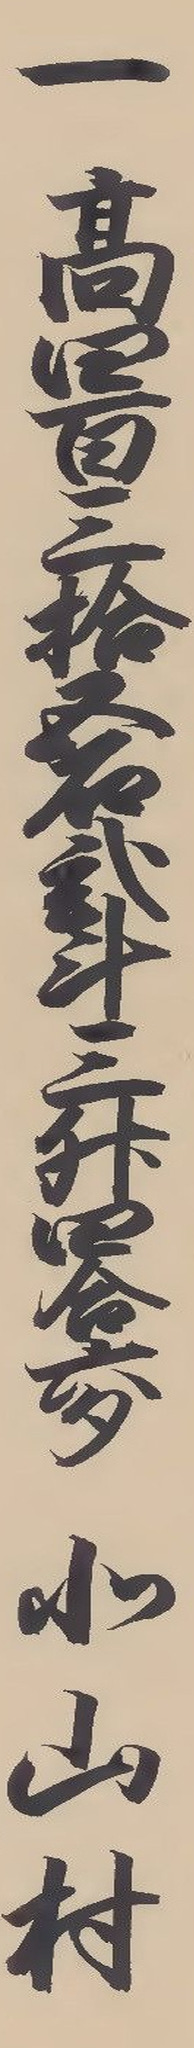一高四百三拾五石弐斗三升四合六勺北山村
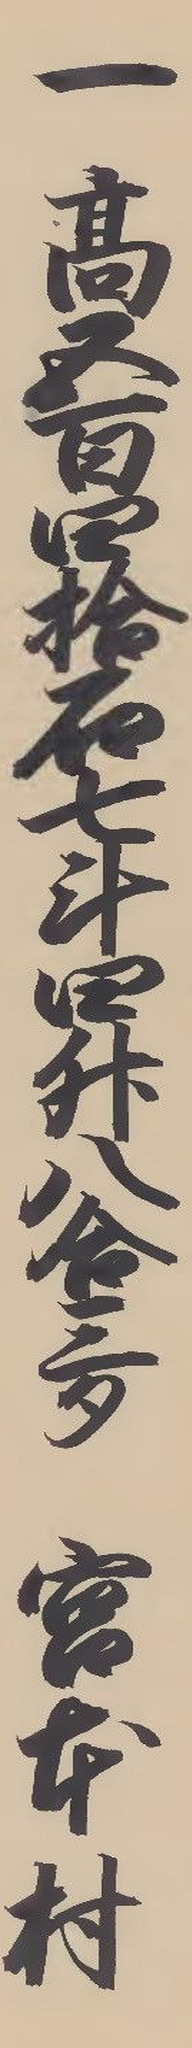一高五百四拾石七斗四升八合三勺宮本村
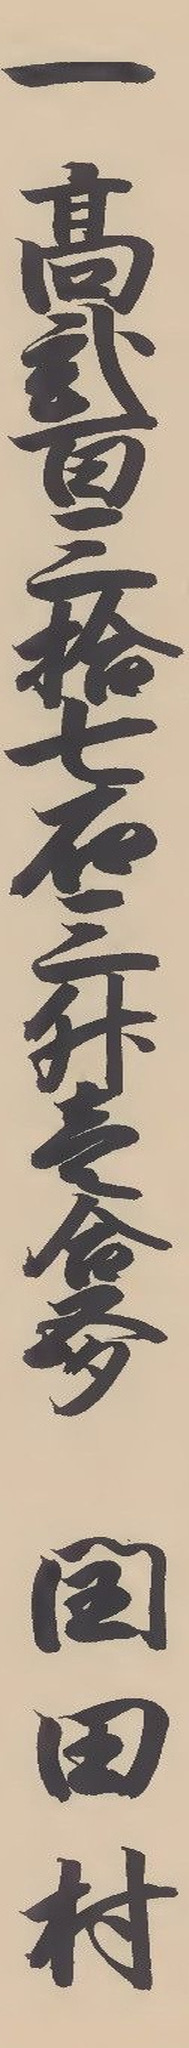一高弐百三拾七石三升壱合五勺閏田村
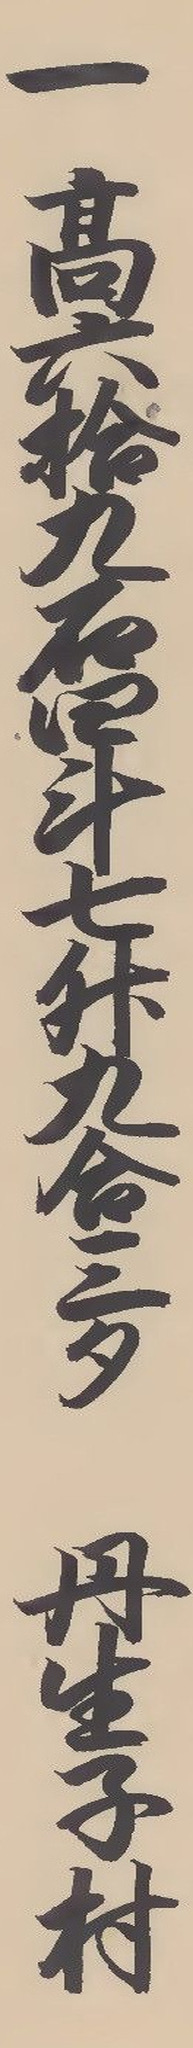一高六拾九石四斗七升九合三勺丹生子村
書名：信濃国郷帳
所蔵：国立公文書館 National Archives of Japan
